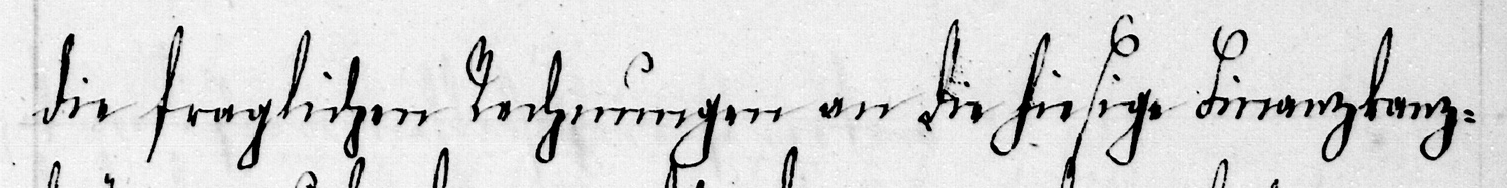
die fraglichen Rechnungen an die hiesige Finanzkanz¬
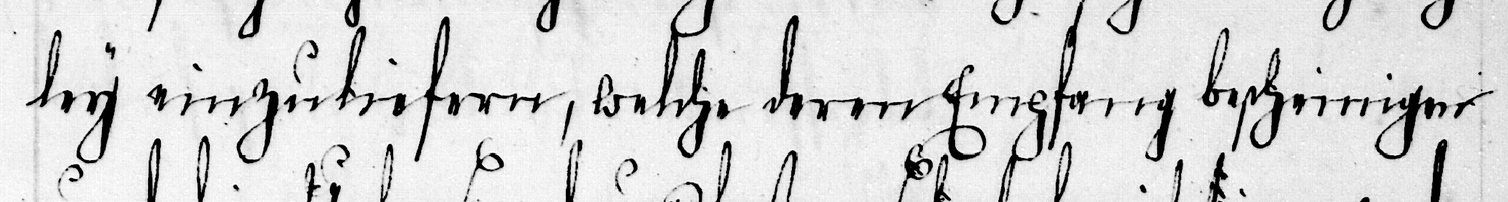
ley einzuliefern, welche deren Empfang bescheinigen
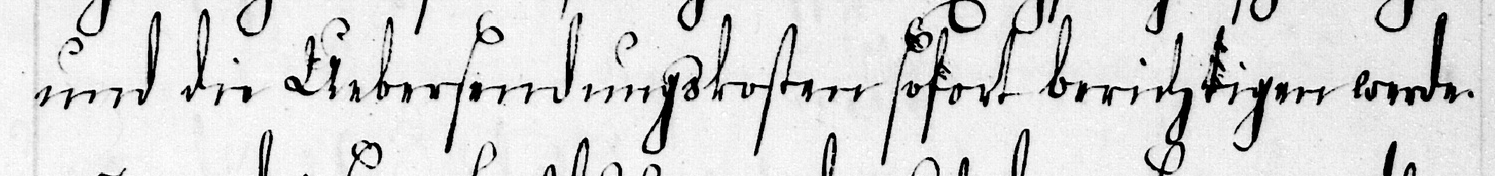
und die Uebersendungskosten sofort berichtigen werde.
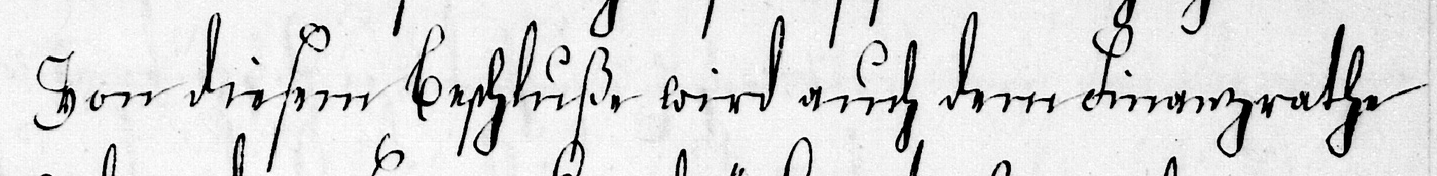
Von diesem Beschluße wird auch dem Finanzrathe
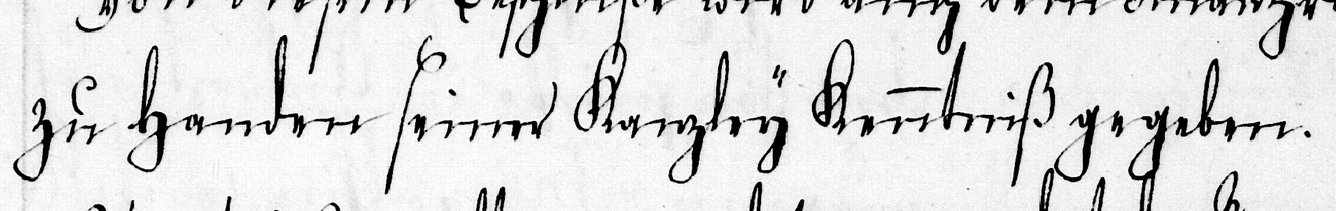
zu Handen seiner Kanzley Kenntniß gegeben.
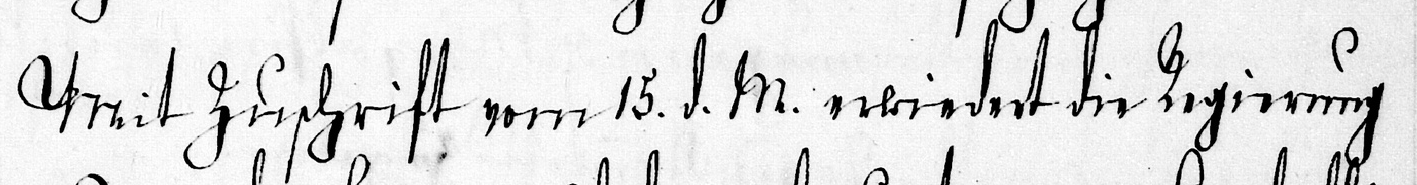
Mit Zuschrift vom 15. d. M. erwiedert die Regierung
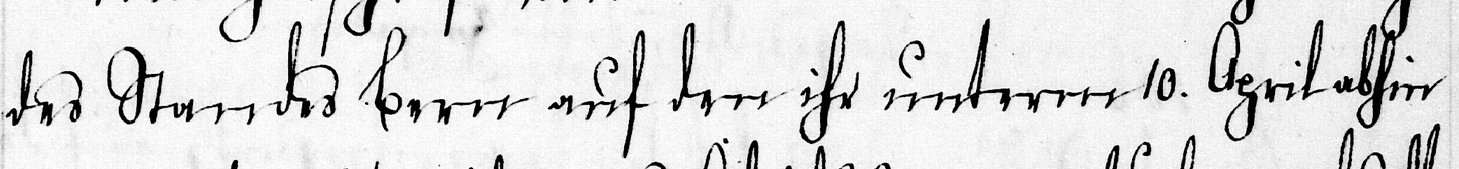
des Standes Bern auf den ihr unterm 10. April abhin
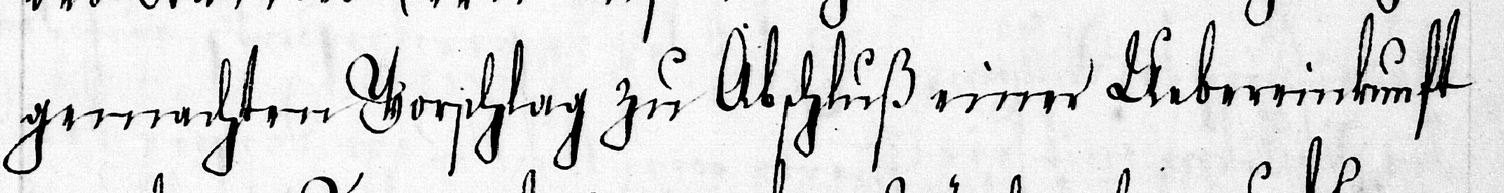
gemachten Vorschlag zu Abschluß einer Uebereinkunft
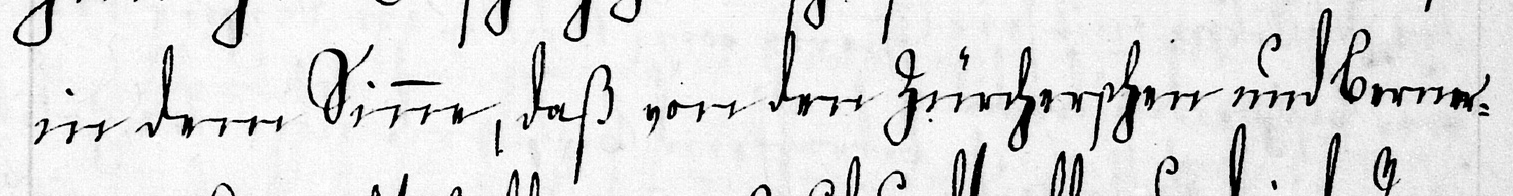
in dem Sinne, daß von den Zürcherschen und Berner¬
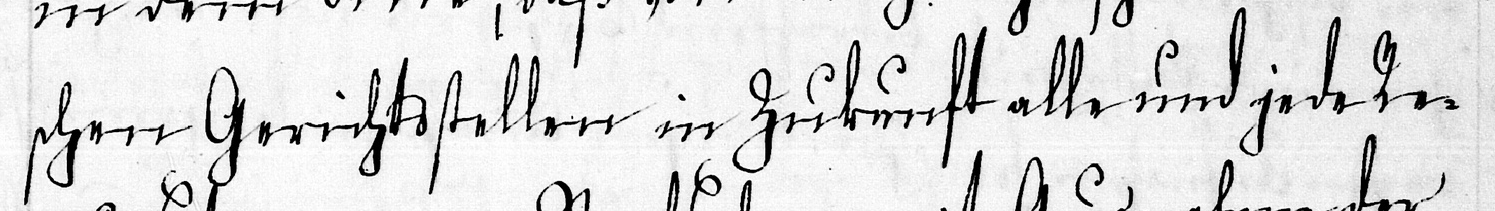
schen Gerichtsstellen in Zukunft alle und jede Re¬
